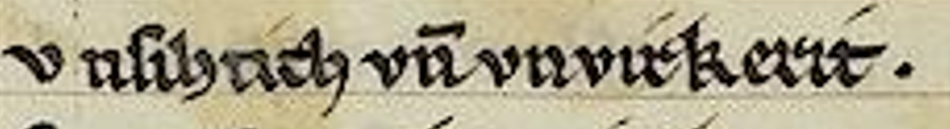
Vnſihtich vn(d) vnvirkerit.
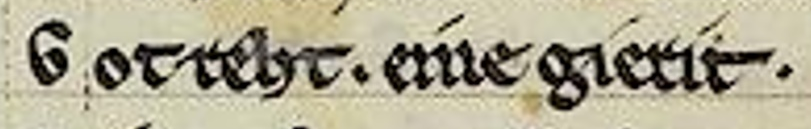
Got reht. eine gierit.
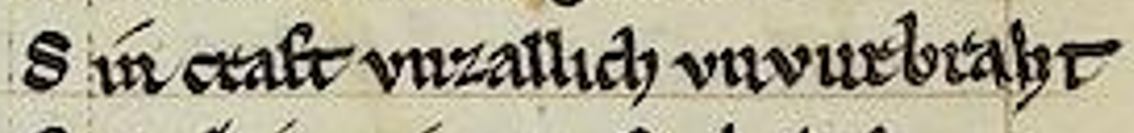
Sin craft vnzallich vnvurbraht
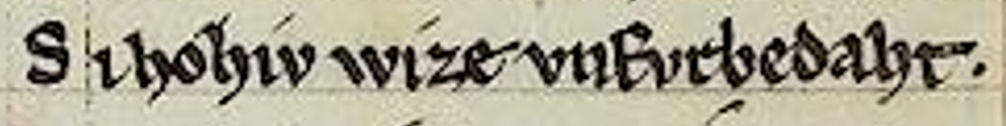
Si hohiv wize vnfvrbedaht.
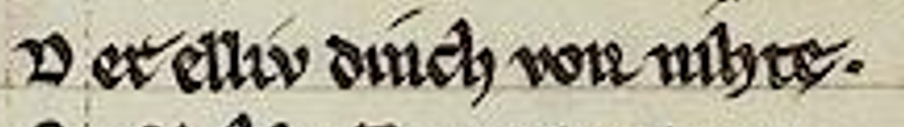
Der elliv dinch von nihte.
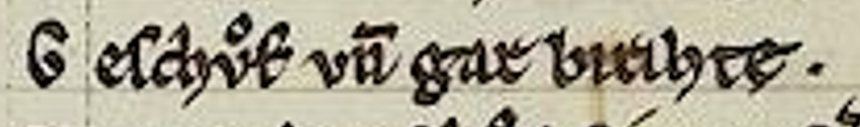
Geſchv°of vn(d) gar birihte.
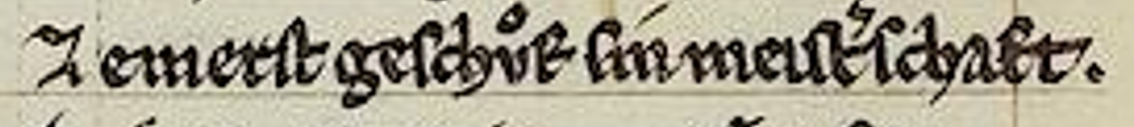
Zemervt geſchv°of ſin meiſt(er)ſchaft.
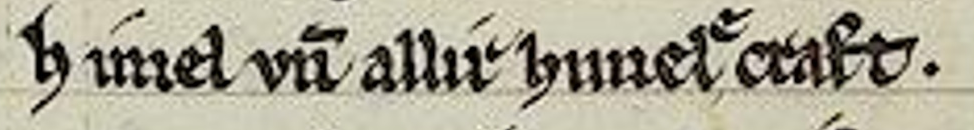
himel vn(d) allir himel°(e) craft.
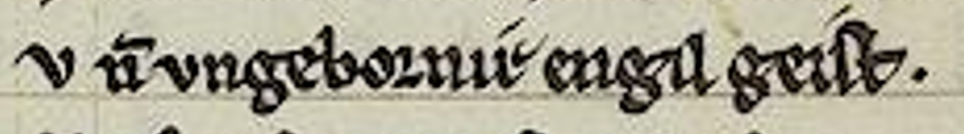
Vn(d) vngebornir engil geiſt.
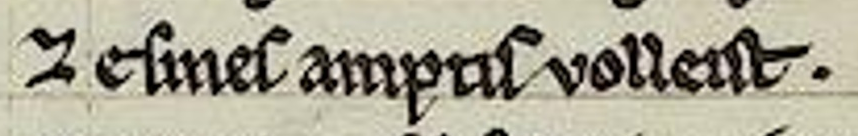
Zeſineſ amptiſ volleiſt.
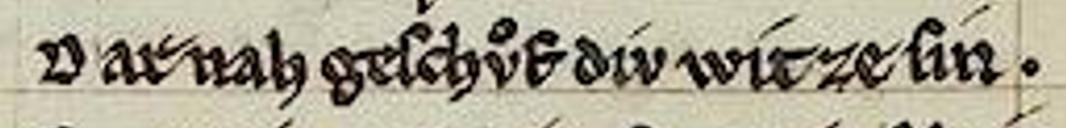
Dar nah geſchv°of div witze ſin.
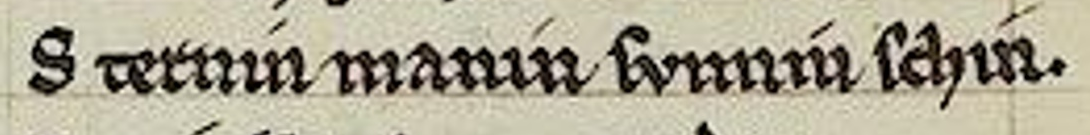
Sternin manin ſvnnin ſchin.
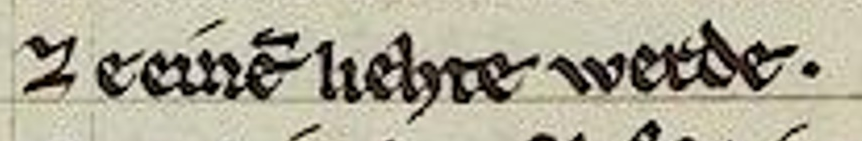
Ze eine(m) liehte werde.
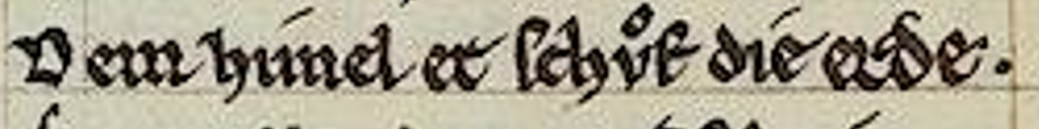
Dem himel er ſchv°of die erde.
